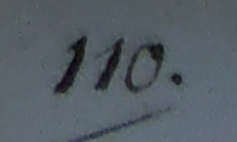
110.
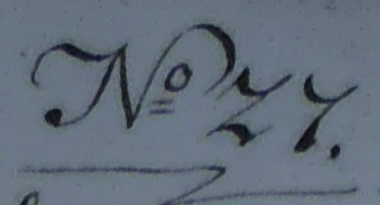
No͇ 27.
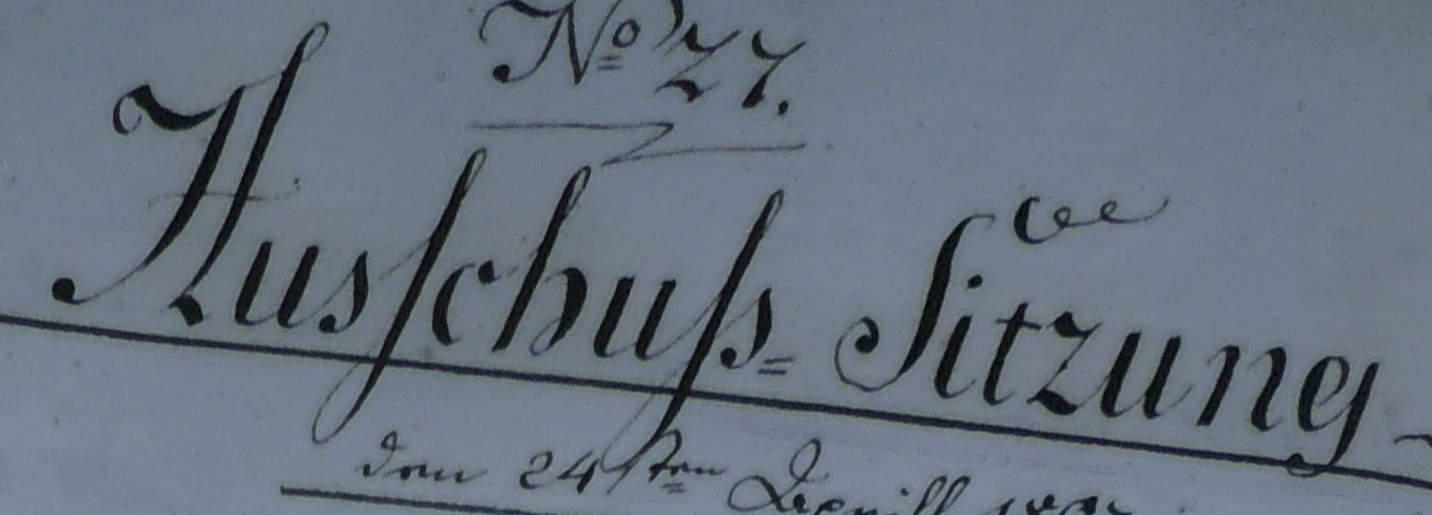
Ausschuss‗Sitzung
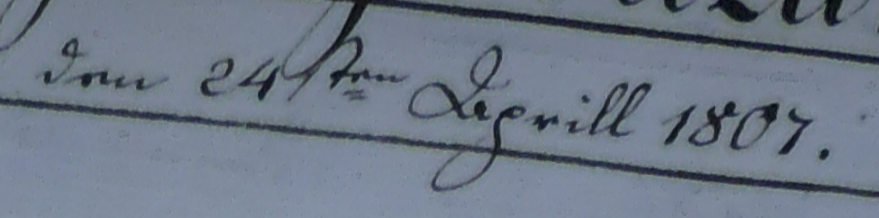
den 24te͇n Aprill 1807.
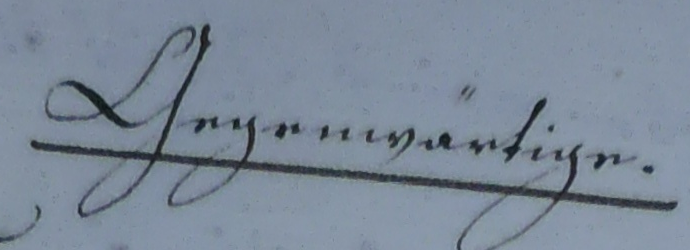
Gegenwärtige.
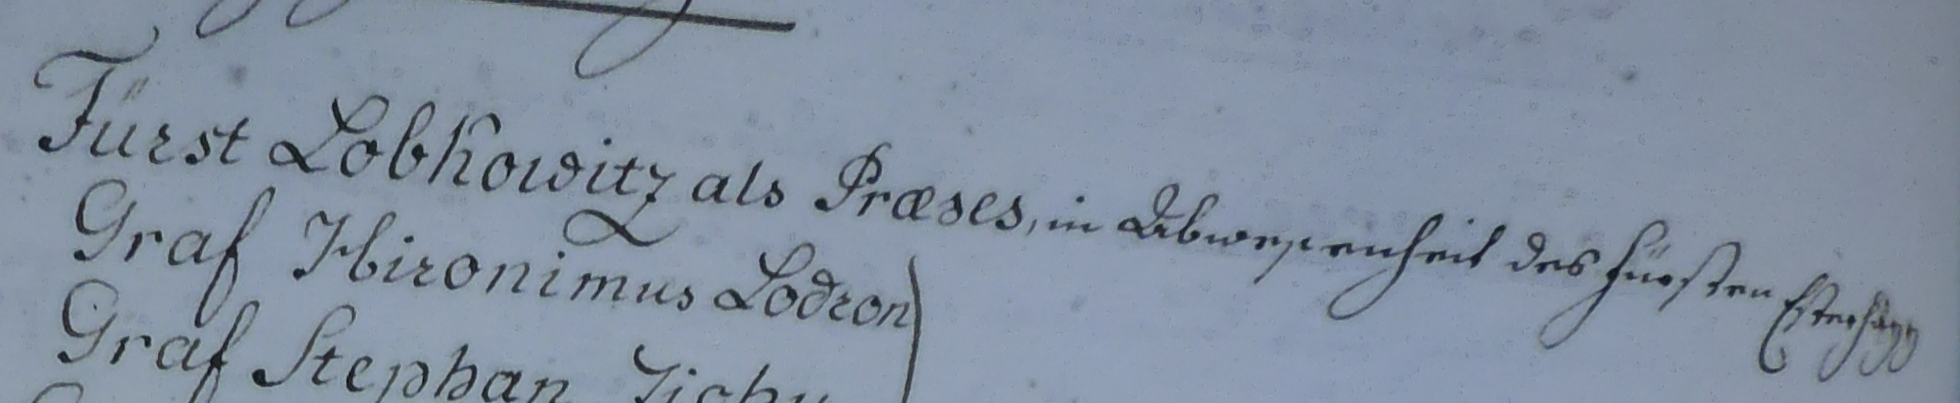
Fürst Lobkowitz als Præses, in Abwesenheit des Fürsten Esterhàzy
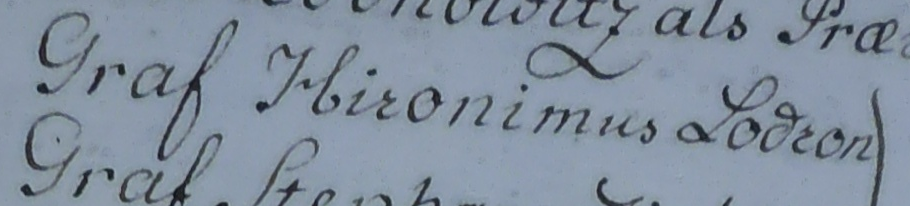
Graf Hironimus Lodron
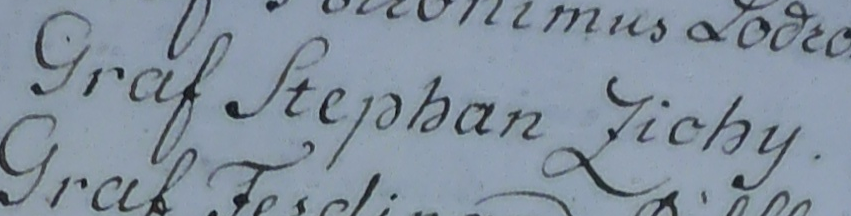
Graf Stephan Zichy.
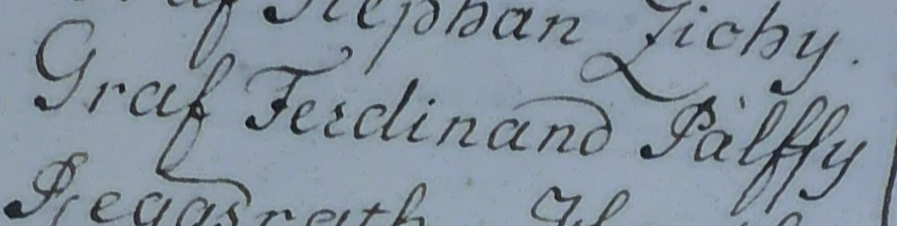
Graf Ferdinand Pàlffy
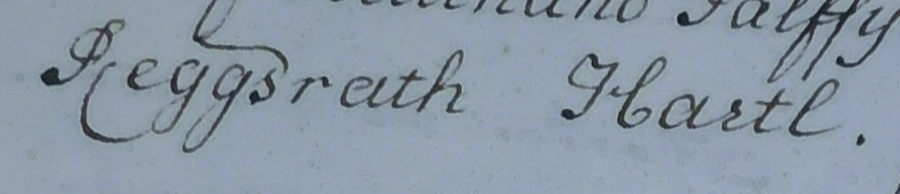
Reg͞gsrath Hartl.
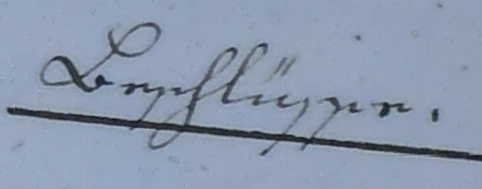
Beschlüsse.
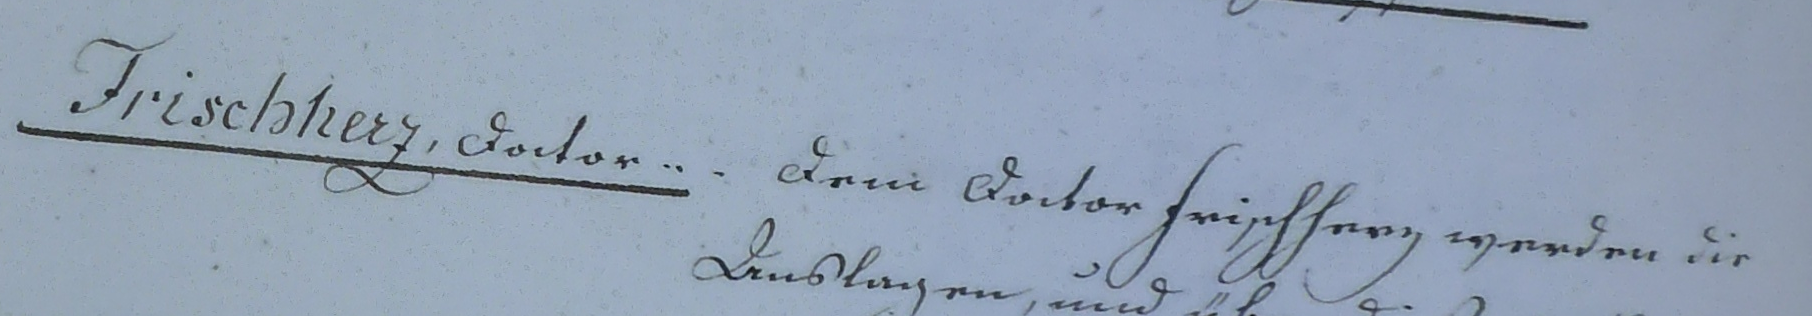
Frischherz, Doctor .. . Dem Doctor Frischerz werden die
